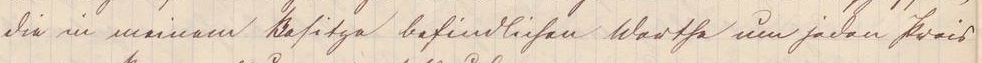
die in meinem Besitze befindlichen Werthe um jeden Preis
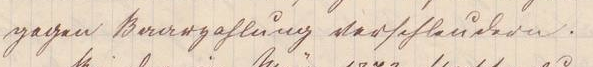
gegen Baarzahlung verschleudern.
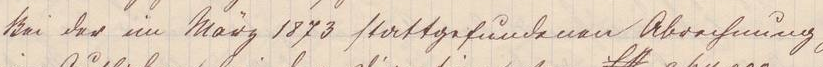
Bei der im März 1873 stattgefundenen Abrechnung
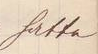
hatte
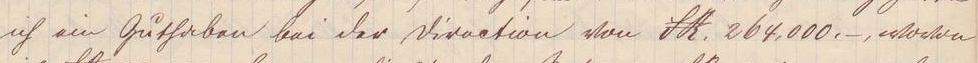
ich ein Guthaben bei der Direction von SR. 264,000.–, wovon
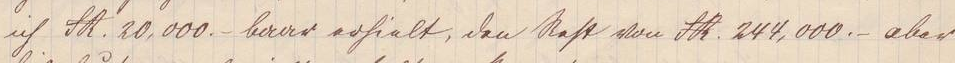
ich SR. 20,000.– baar erhielt, den Rest von SR. 244,000.– aber
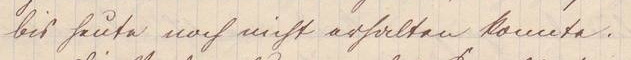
bis heute noch nicht erhalten konnte.
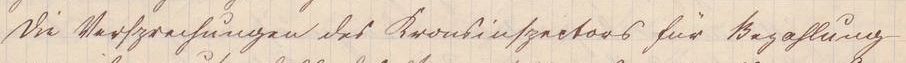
Die Versprechungen des Kronsinspectors für Bezahlung
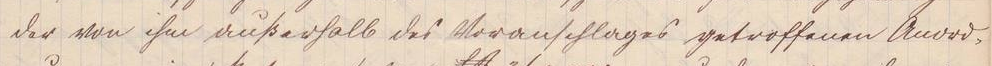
der von ihm außerhalb der Voranschlages getroffenen Anord-
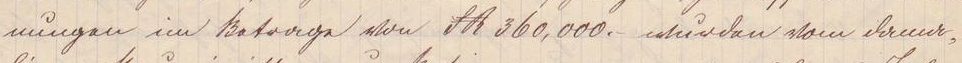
nungen im Betrage von SR 360,000.– wurden vom dama-
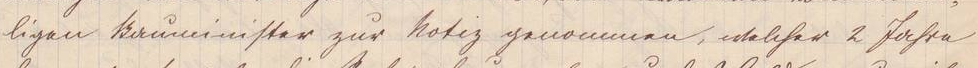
ligen Bauminister zur Notiz genommen, welcher 2 Jahre
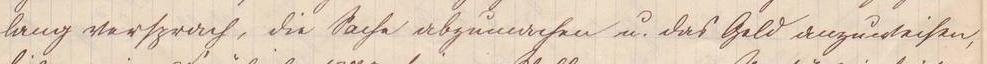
lang versprach, die Sache abzumachen u. das Geld anzuweisen,
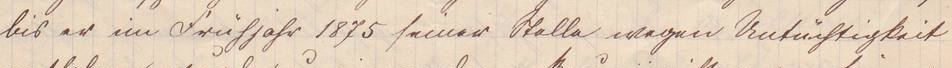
bis er im Frühjahre 1875 seiner Stelle wegen Untüchtigkeit
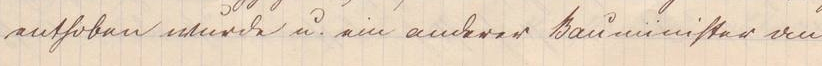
enthoben wurde u. ein anderer Bauminister an
